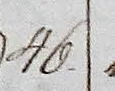46.
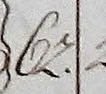62.
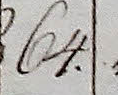64.
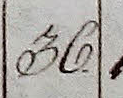36.
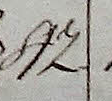42.
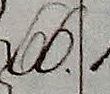66.
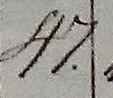47.
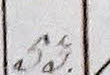53.
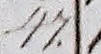47.
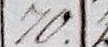70.
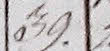39.
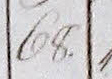68.
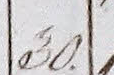30.
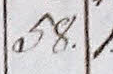58.
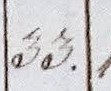33.
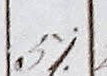51.
